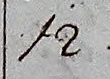12
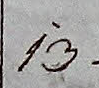13
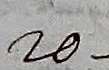20
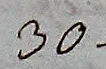30
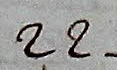22
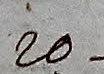20
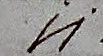11
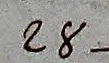28
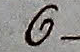6
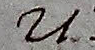21
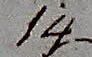14
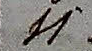11
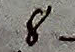8
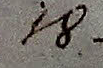18
